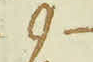9
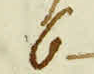6
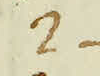2
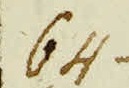64
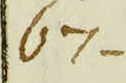67
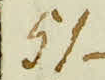51
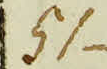51
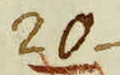20
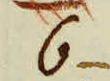6
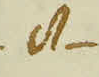8
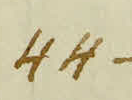44
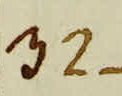32
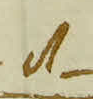8
